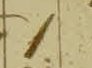1.
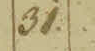31.
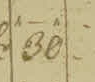30
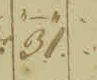31.
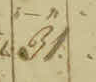31.
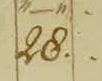28.
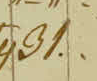31.
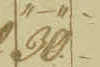30.
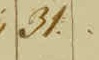31.
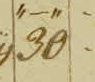30
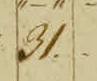31.
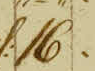16
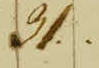31.
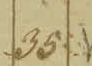35
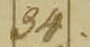34
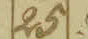25
